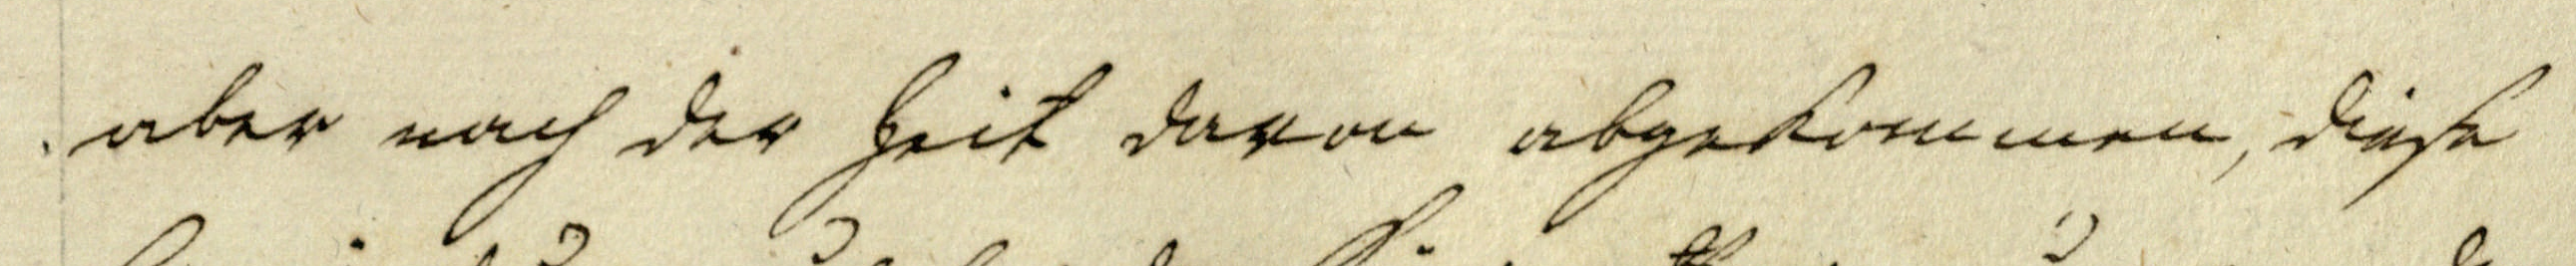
aber nach der Zeit davon abgekommen, diese
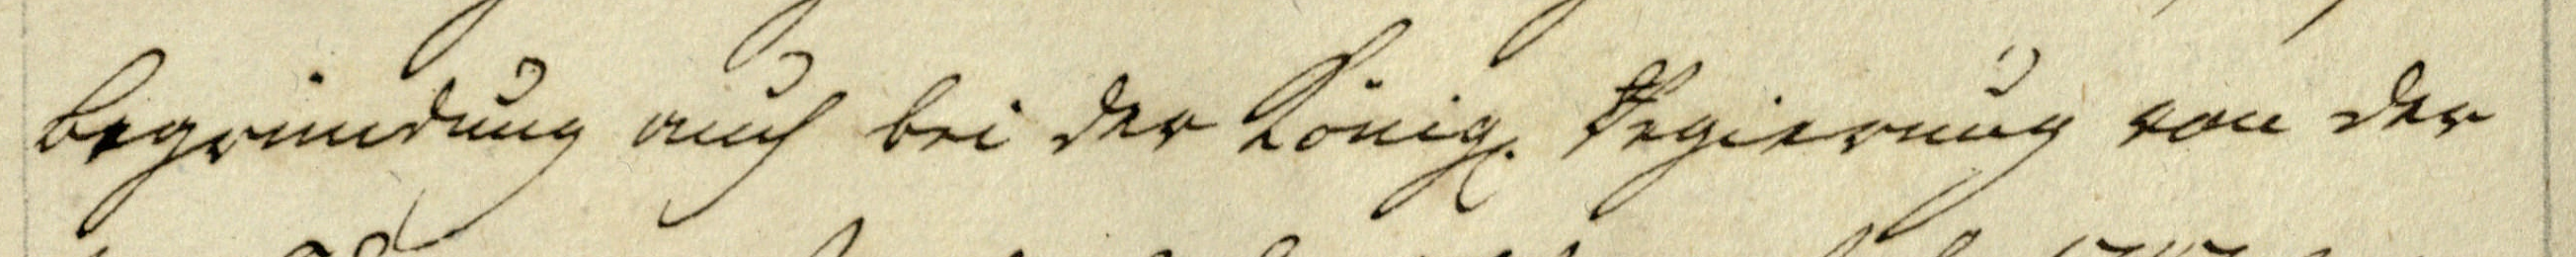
Begründung auch bei der Königl. Regierung von der
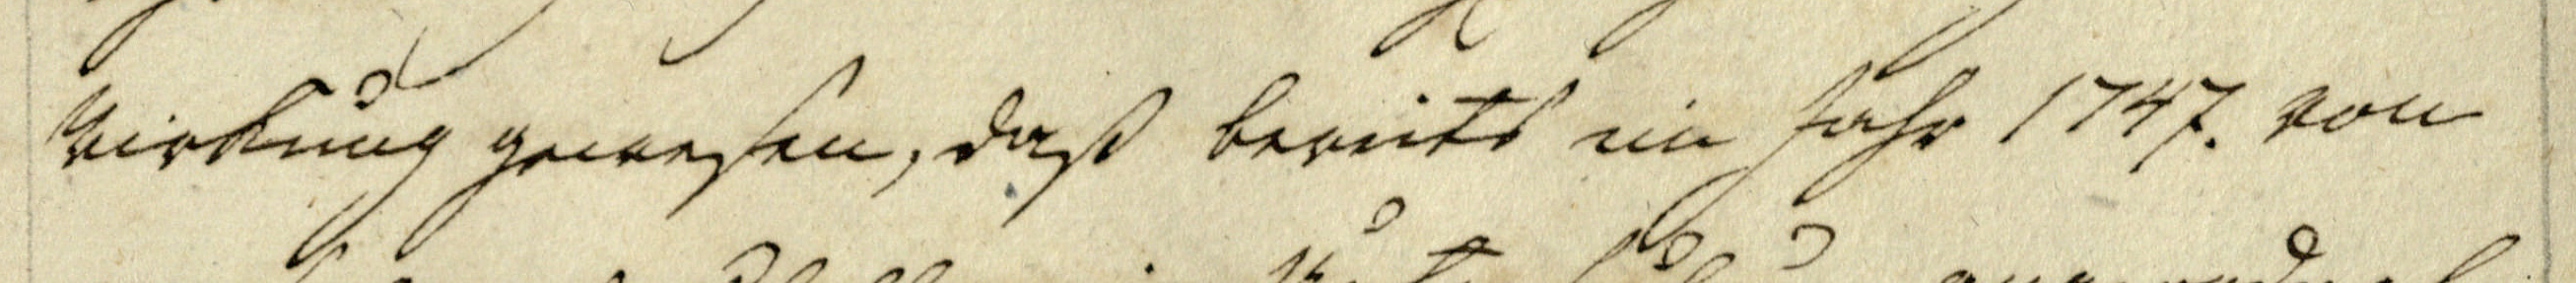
Wirkung gewesen, daß bereits im Jahr 1747. von
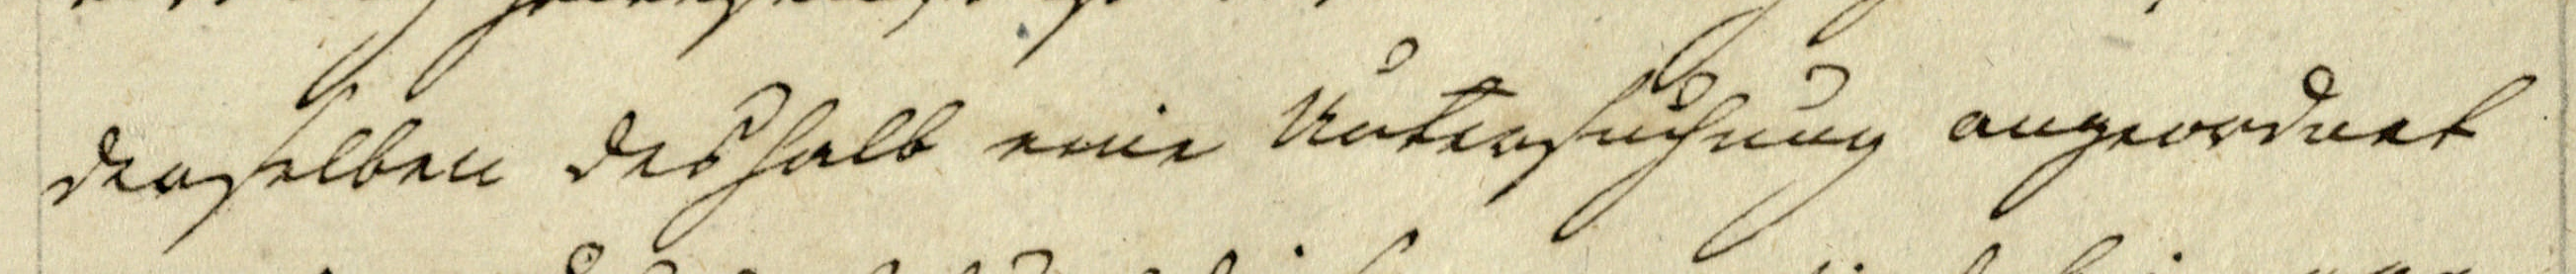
derselben deshalb eine Untersuchung angeordnet
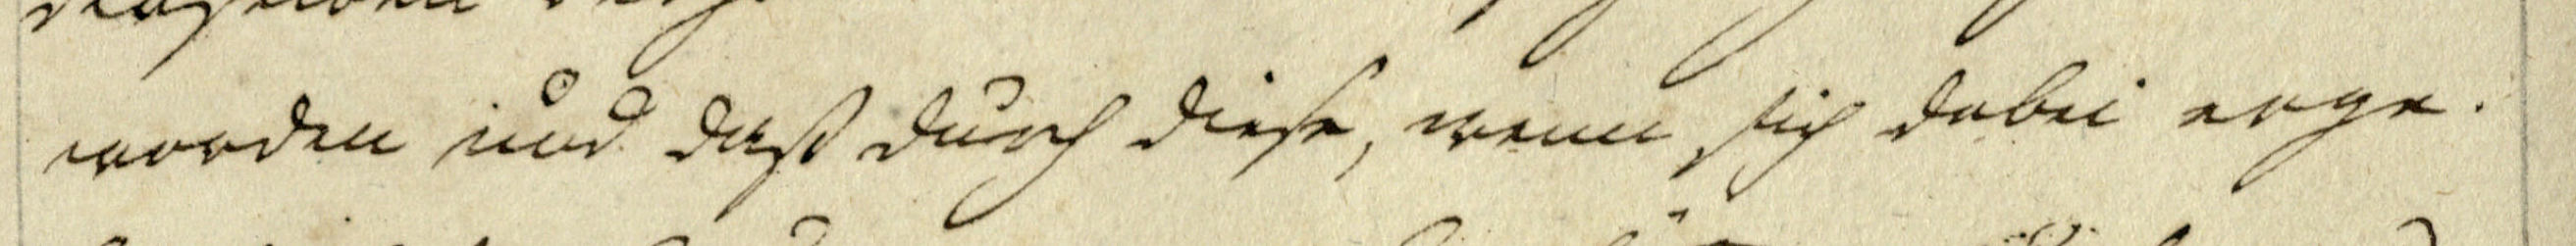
worden und daß durch diese, wenn sich dabei erge¬
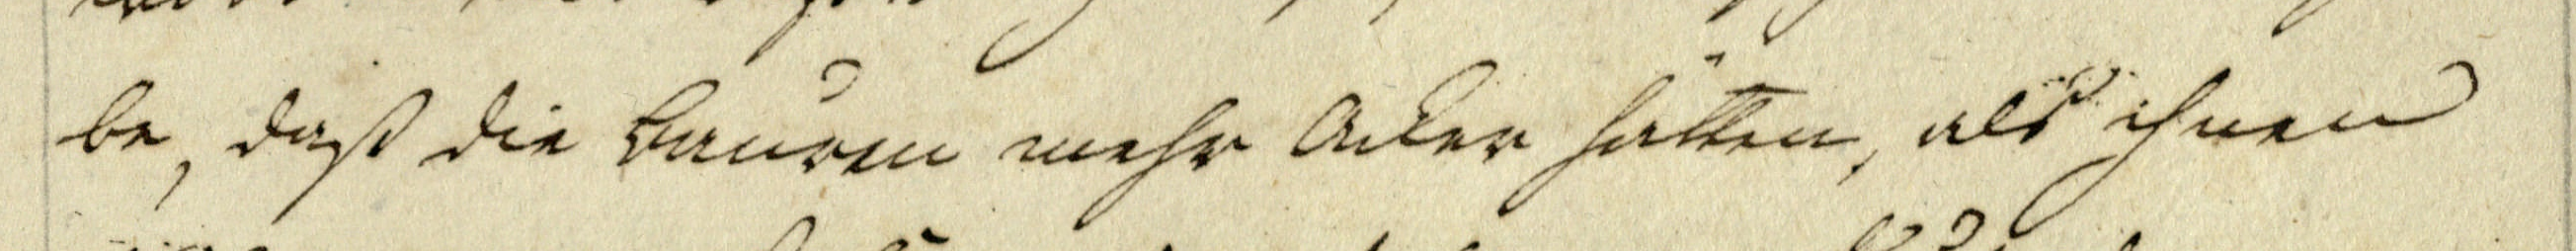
be, daß die Bauren mehr Acker hätten, als ihnen
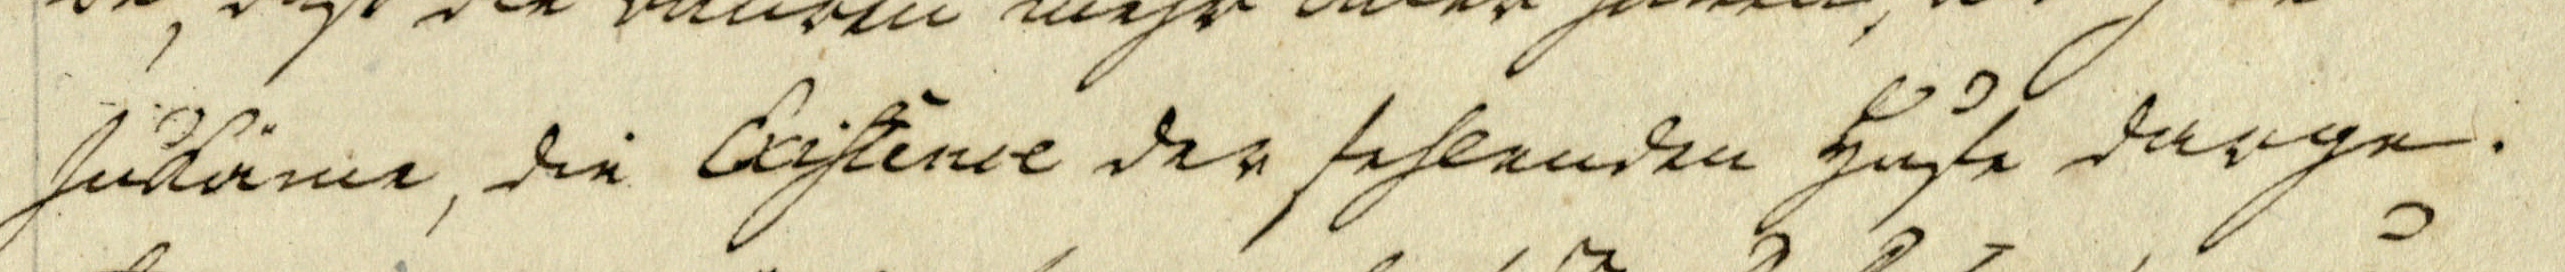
zukäme, die Existence der fehlenden Hufe darge¬
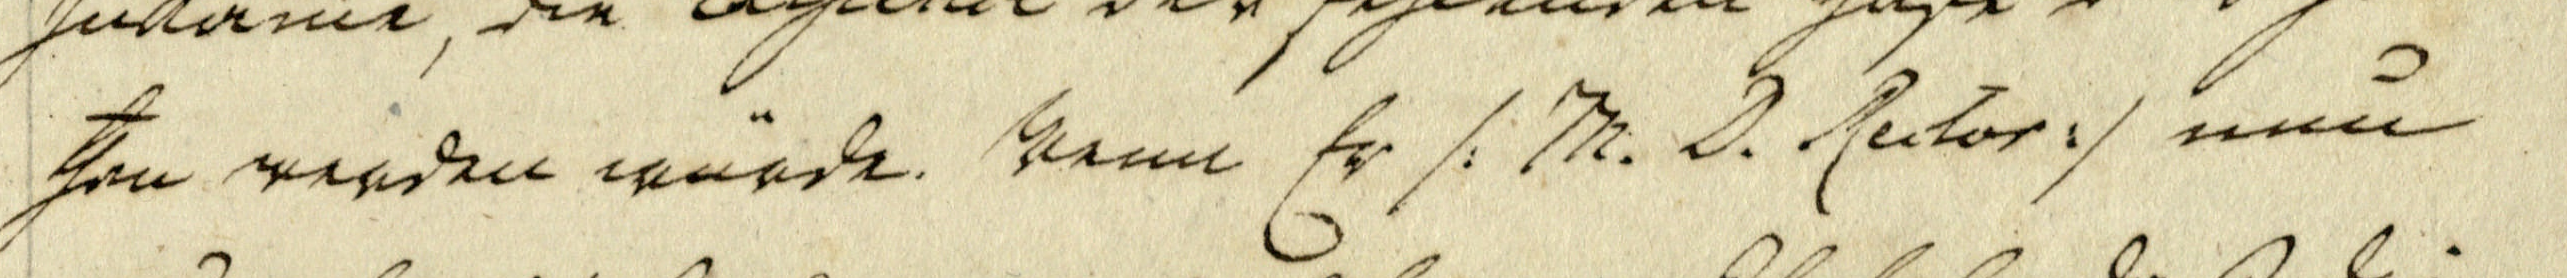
than werden würde. Wenn Er /. M. D. Rector :/ nun
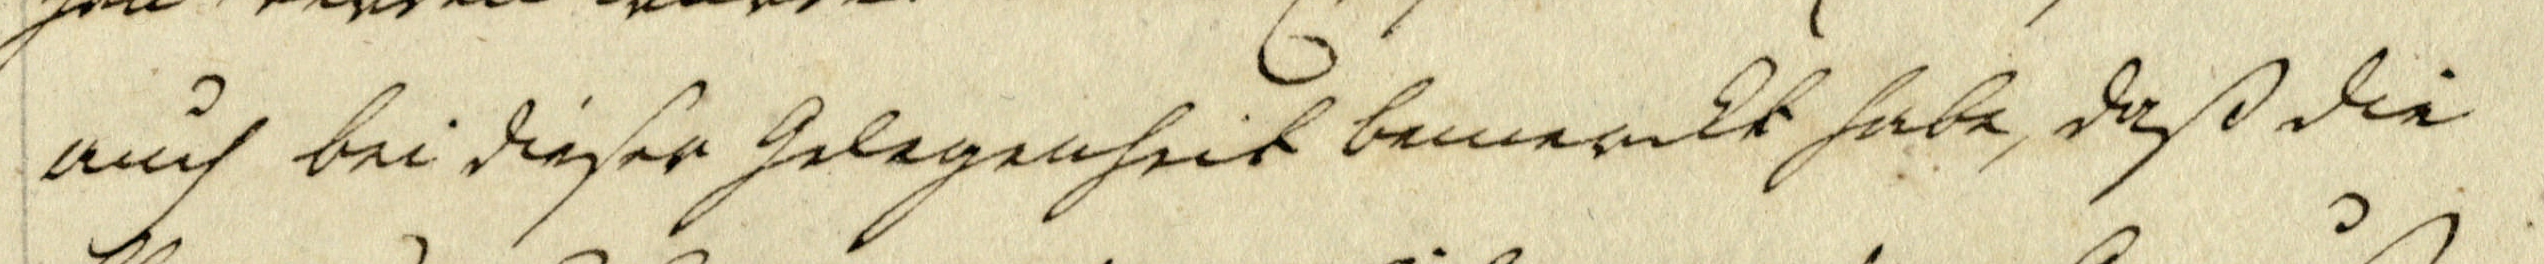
auch bei dieser Gelegenheit bemerckt habe, daß die
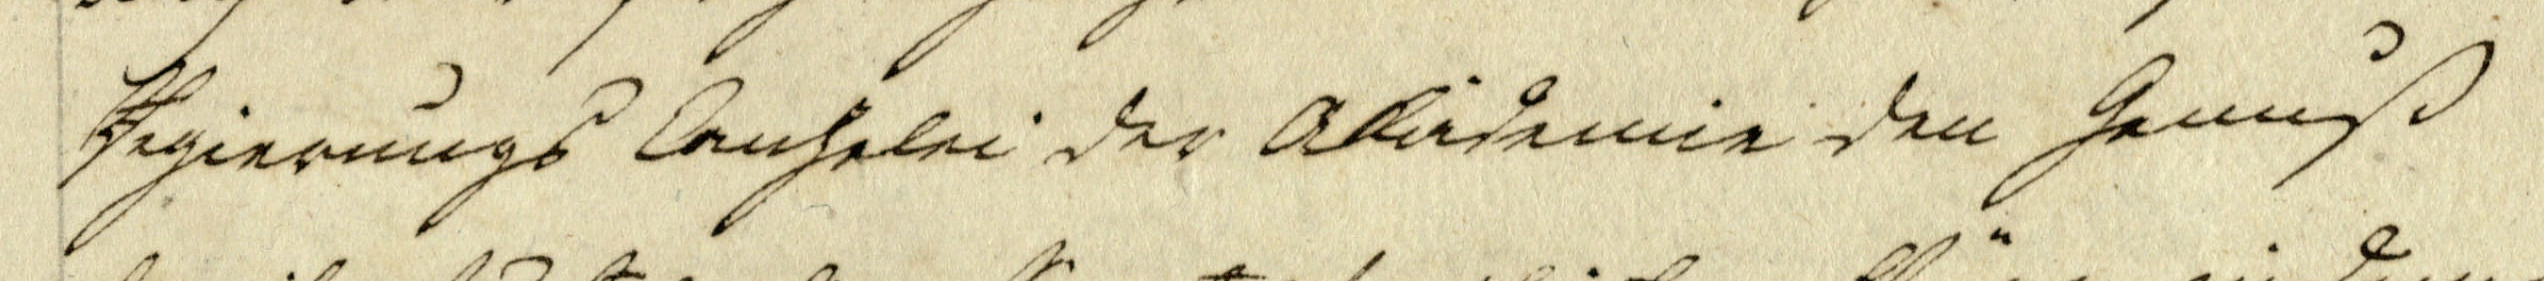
Regierungs Canzelei der Akademie den Genuß
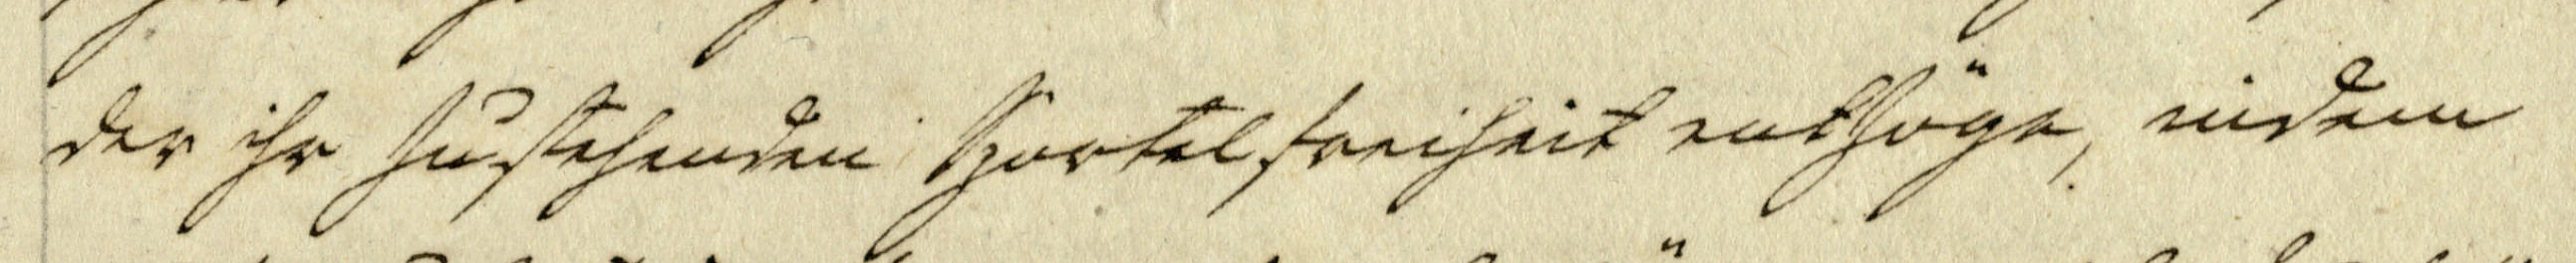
der ihr zustehenden Sportelfreiheit entzöge, indem
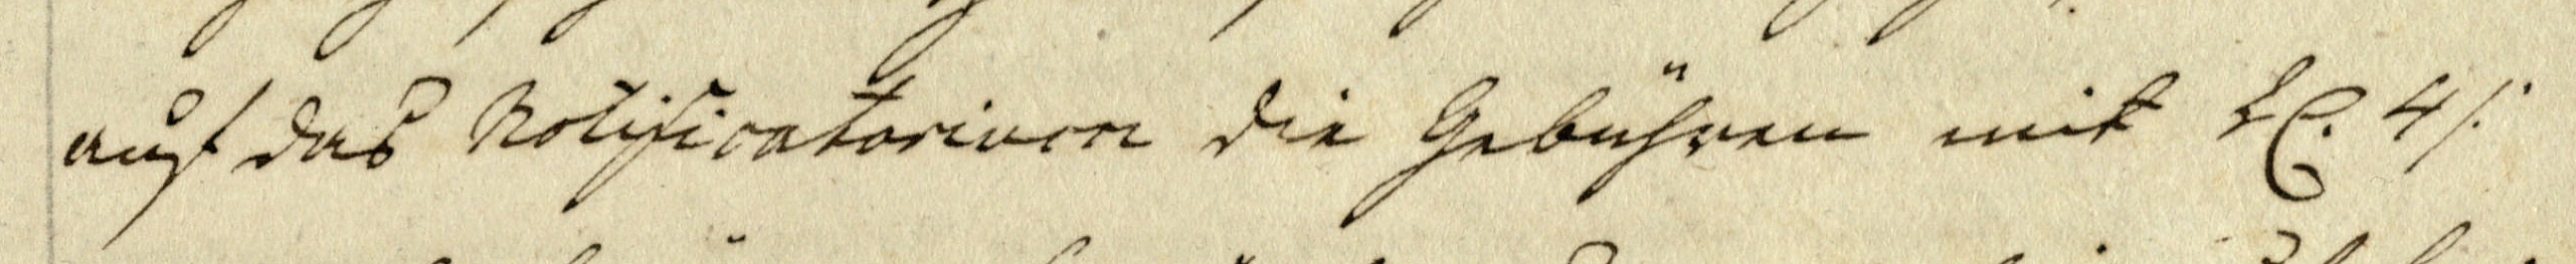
auf das Notificatorium die Gebühren mit 2 l. 4 s.
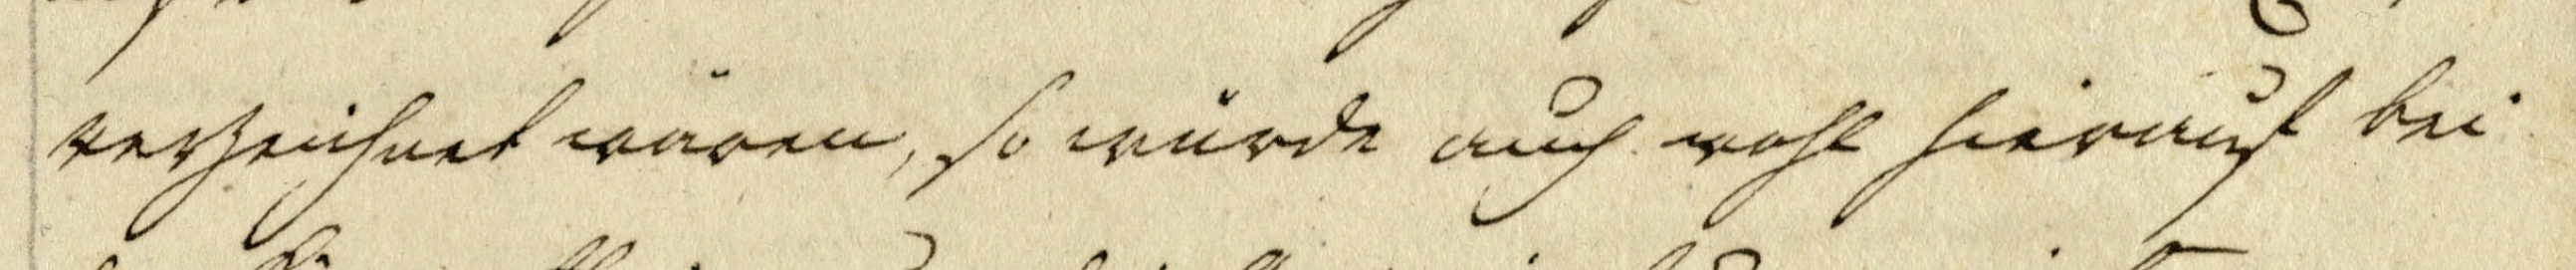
verzeichnet wären, so würde auch wohl hierauf bei
